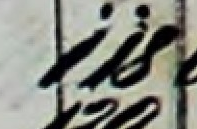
118
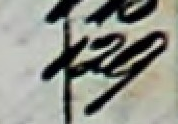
129
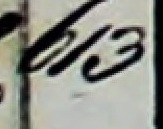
613
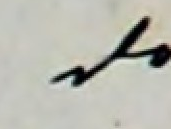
do
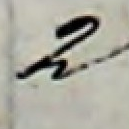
2
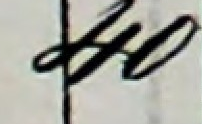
40
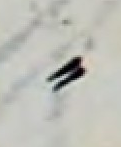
„
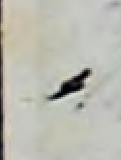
„
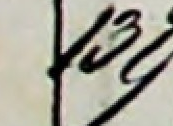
139
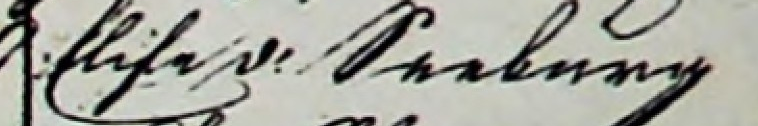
Elise v. Saeburg
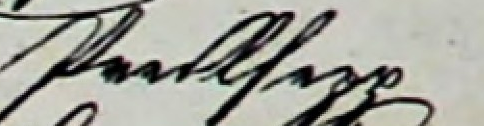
Preslsepp
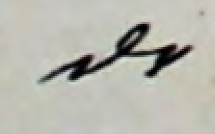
do
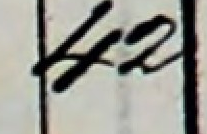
42
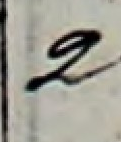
2
